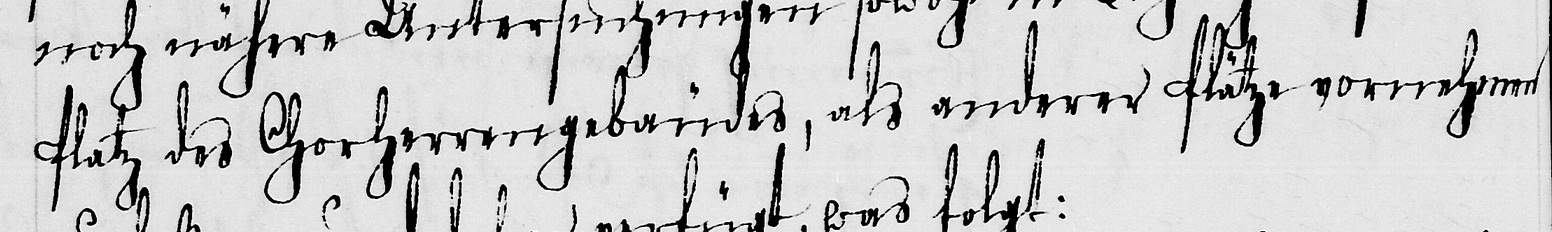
Platz des Chorherrengebäudes, als anderer Plätze vornehmen
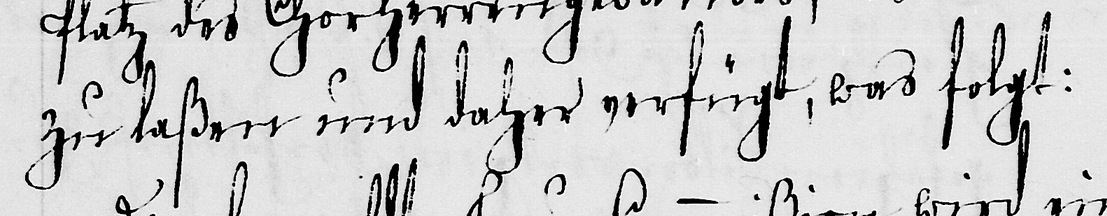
zu laßen und daher verfügt, was folgt:
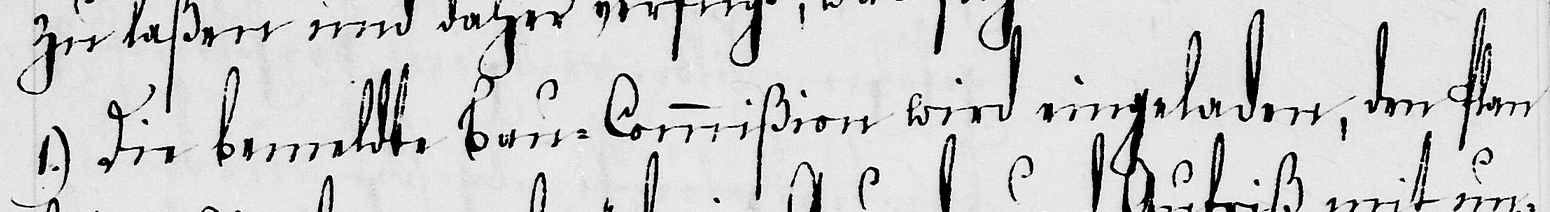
1.) Die bemeldte Bau-Commißion wird eingeladen, den Plan
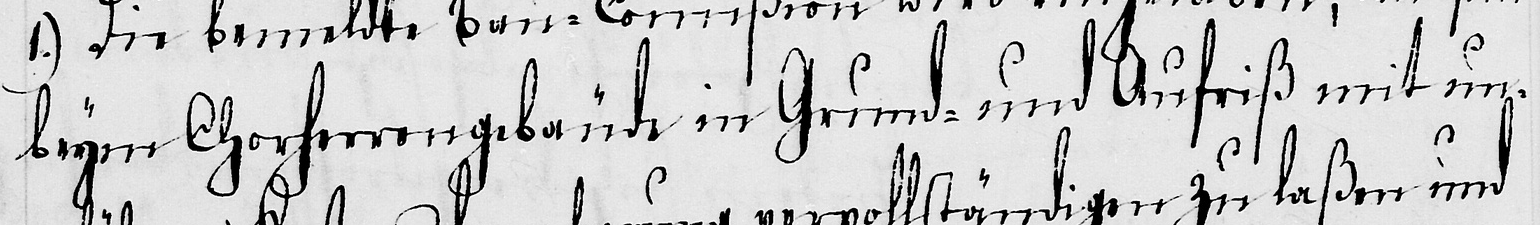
beym Chorherrengebäude in Grund- und Aufriß mit un¬
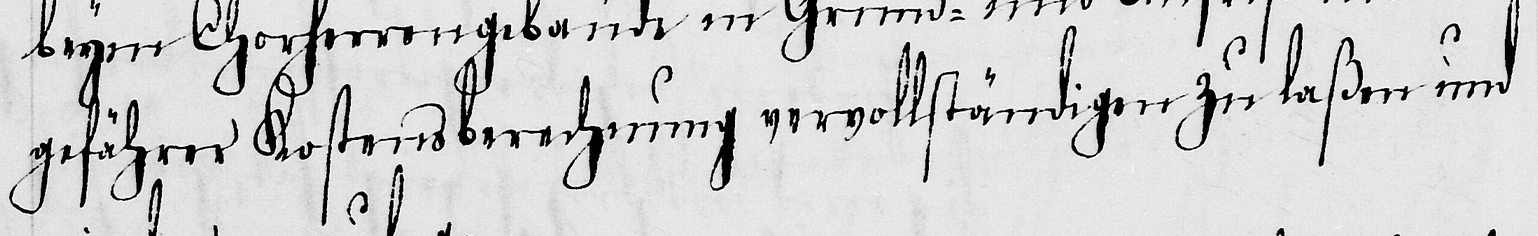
gefährer Kostensberechnung vervollständigen zu laßen und
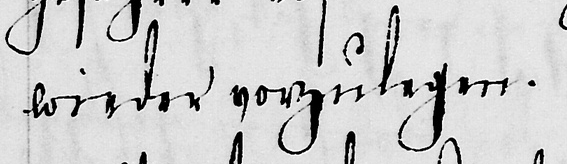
wieder vorzulegen.
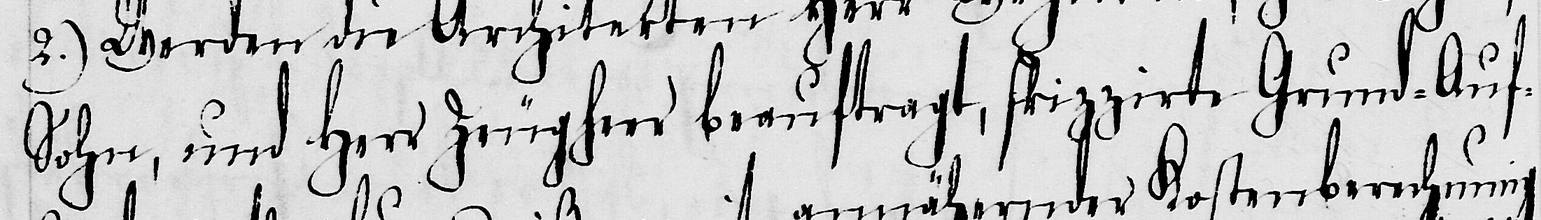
Sohn, und Herr Zeugherr beauftragt, skizzirte Grund-Auf-
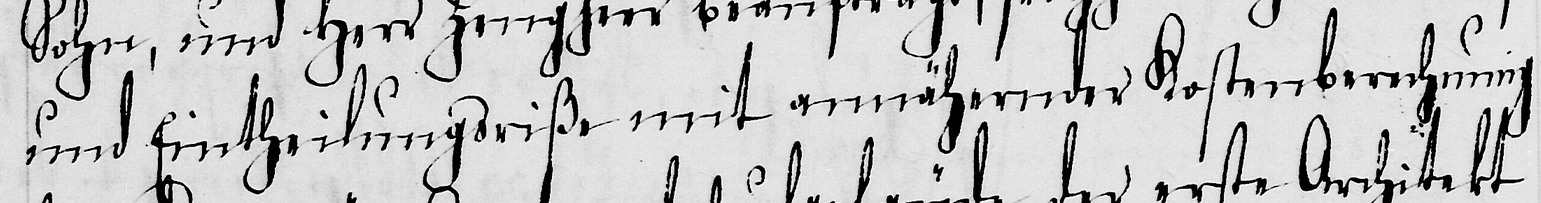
und Eintheilungsriße mit annähernder Kostenberechnung
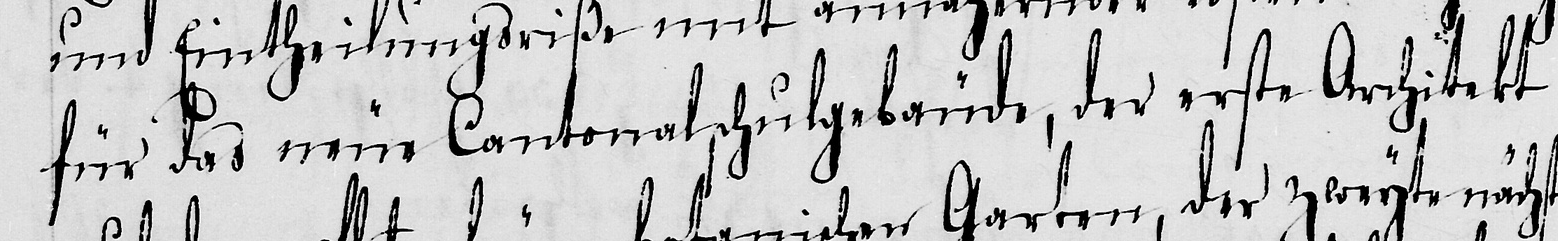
für das neue Cantonalschulgebäude, der erste Architekt
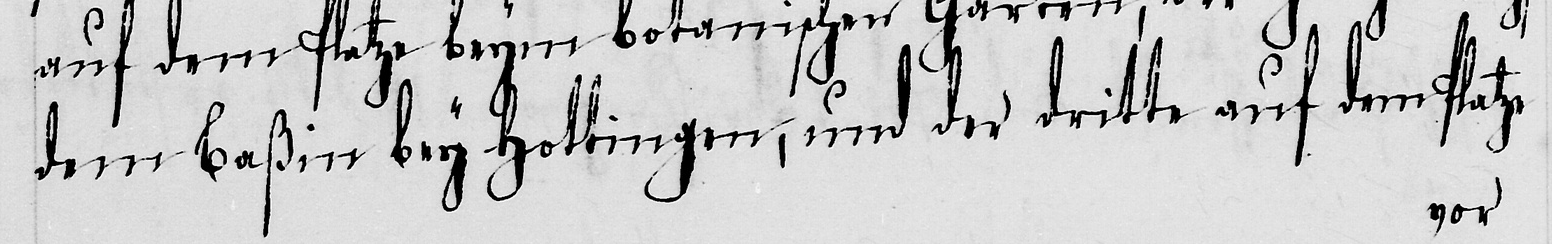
dem Baßin bey Hottingen, und der dritte auf dem Platze
